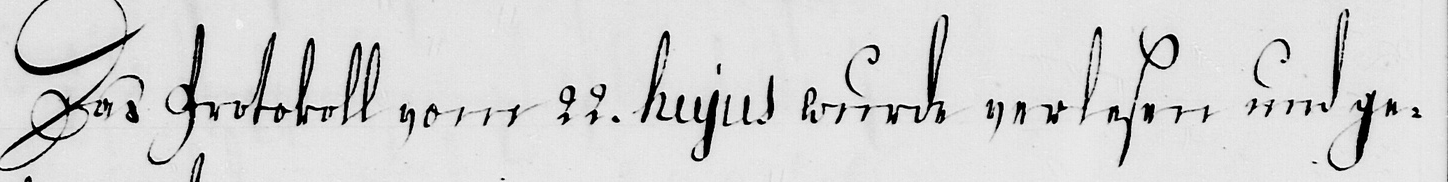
Das Protokoll vom 22. hujus wurde verlesen und ge¬
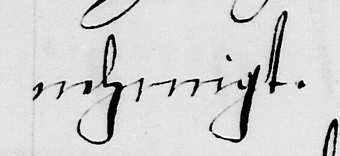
nehmigt.
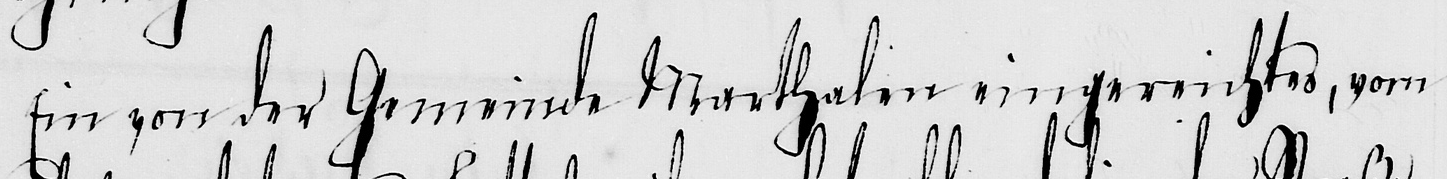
Ein von der Gemeinde Marthalen eingereichtes, vom
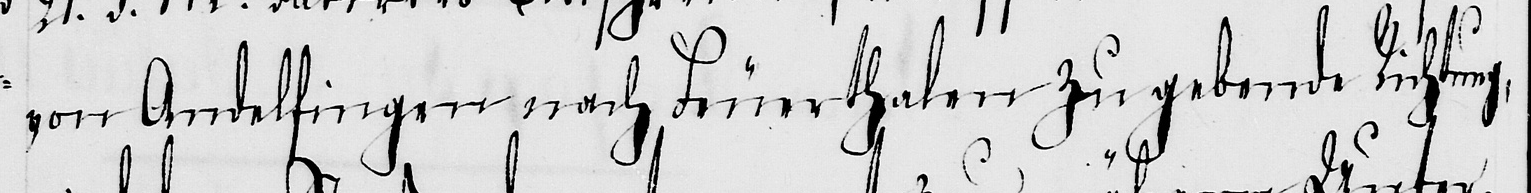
von Andelfingen nach Feuerthalen zu gebende Richtun¬
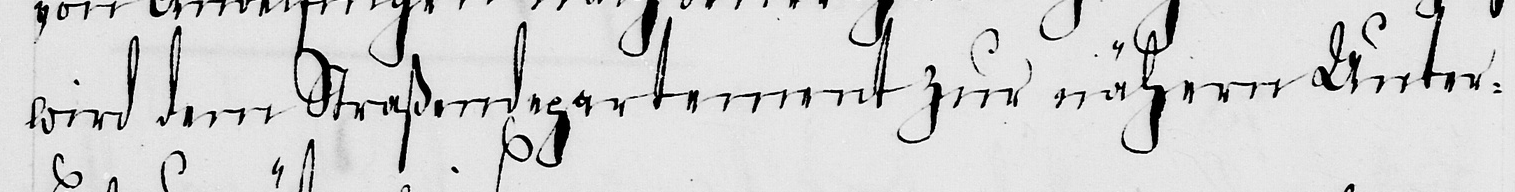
wird dem Straßendepartement zur nähern Unter¬
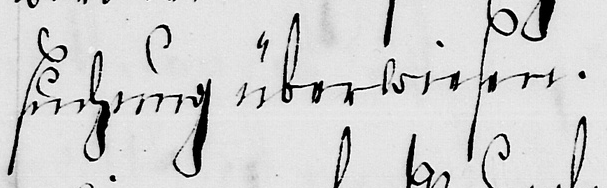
suchung überwiesen.
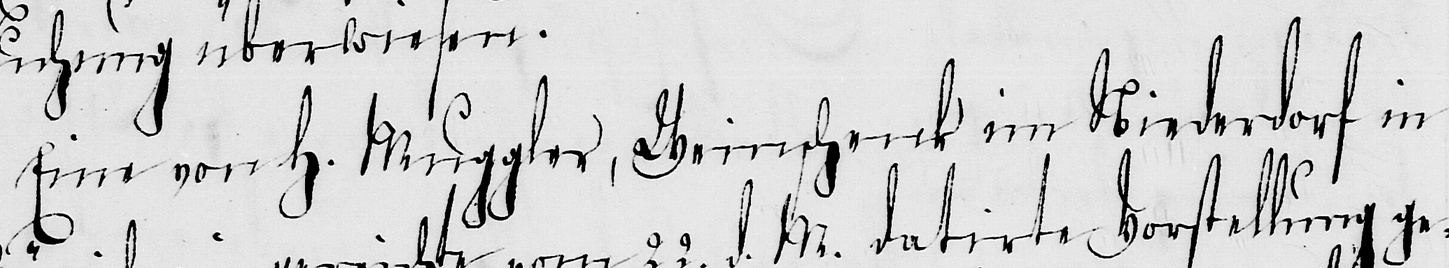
Eine von H. Muggler, Weinschenk im Niederdorf in
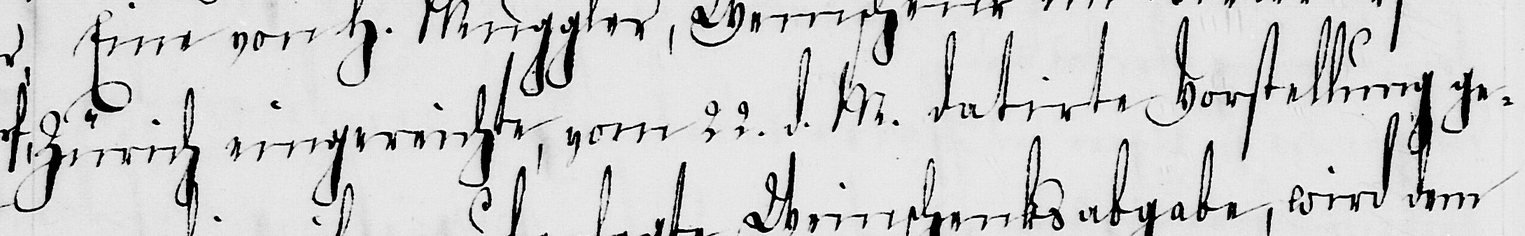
Zürich eingereichte, vom 22. d. M. datirte Vorstellung ge¬
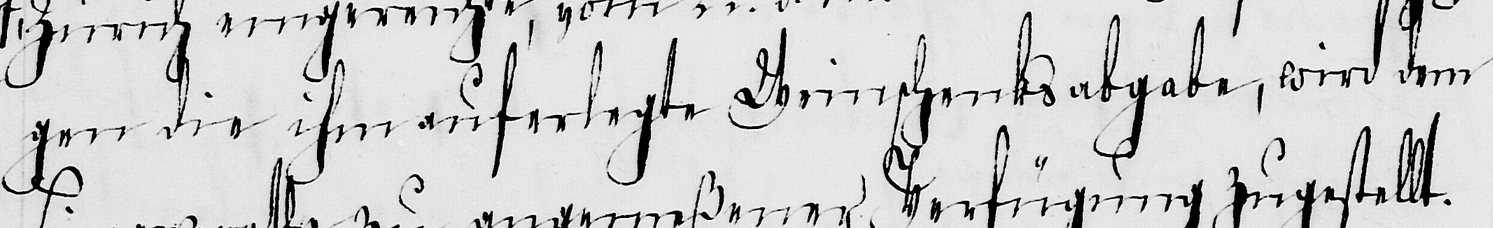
gen die ihm auferlegte Weinschenkabgabe, wird dem
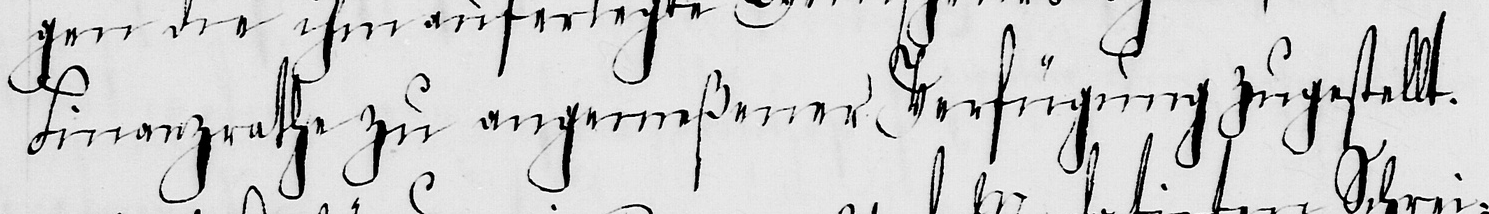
Finanzrathe zu angemeßener Verfügung zugestellt.
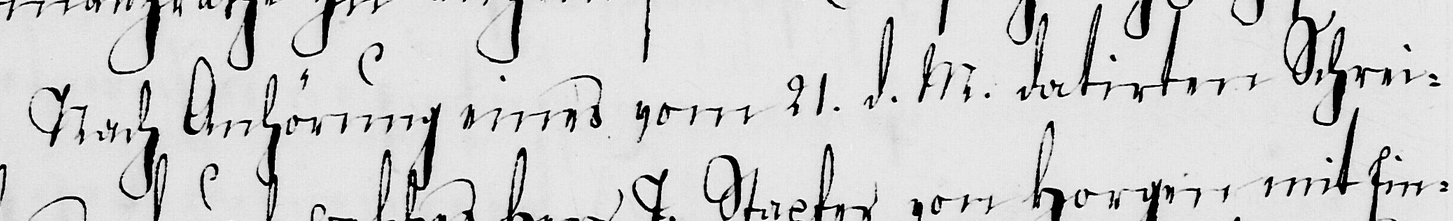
Nach Anhörung eines vom 21. d. M. datirten Schrei¬
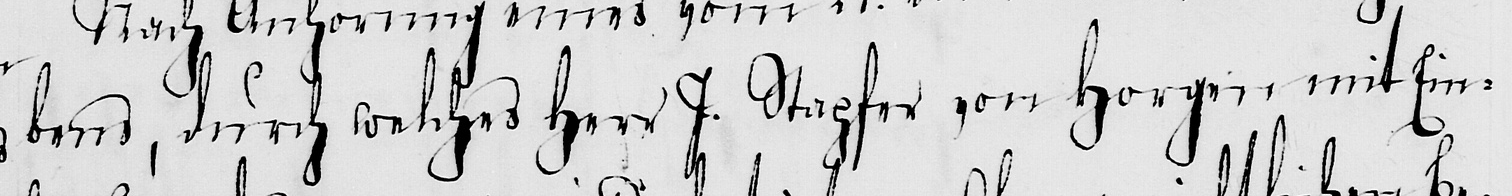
bens, durch welches Herr J. Stapfer von Horgen mit Ein¬
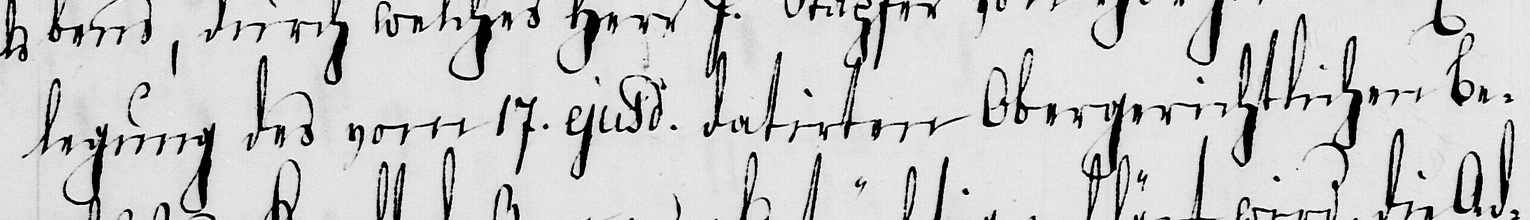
legung des vom 17. ejusd. datirten Obergerichtlichen Be¬
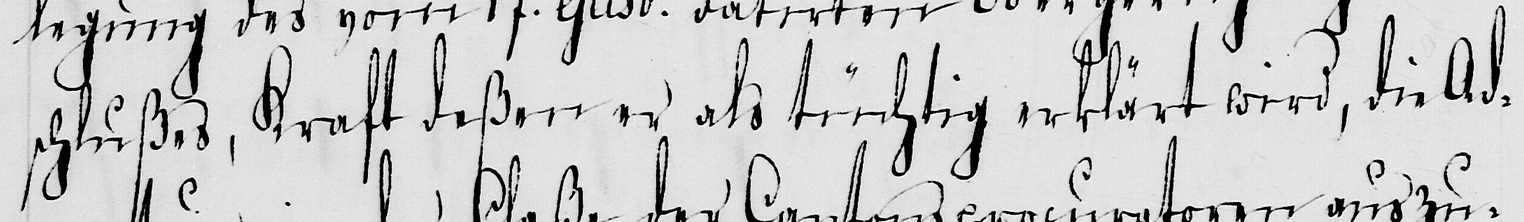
schlußes, Kraft deßen er als tüchtig erklärt wird, die Ad¬
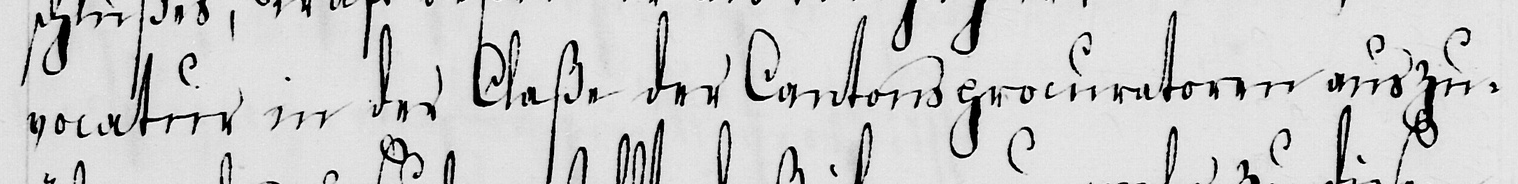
vocatur in der Claße der Cantonsprocuratoren auszu¬
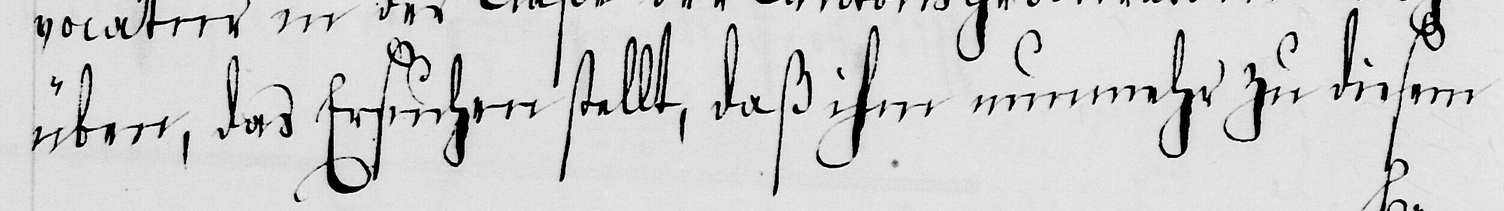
üben, das Ersuchen stellt, daß ihm nunmehr zu diesem
